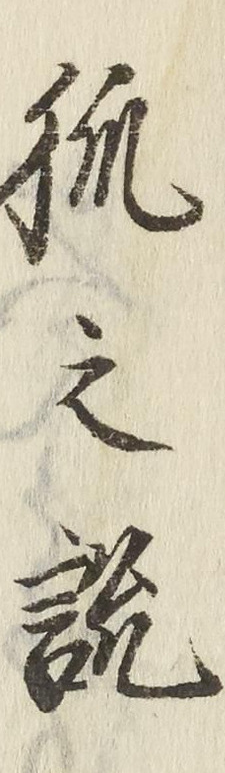狐之説
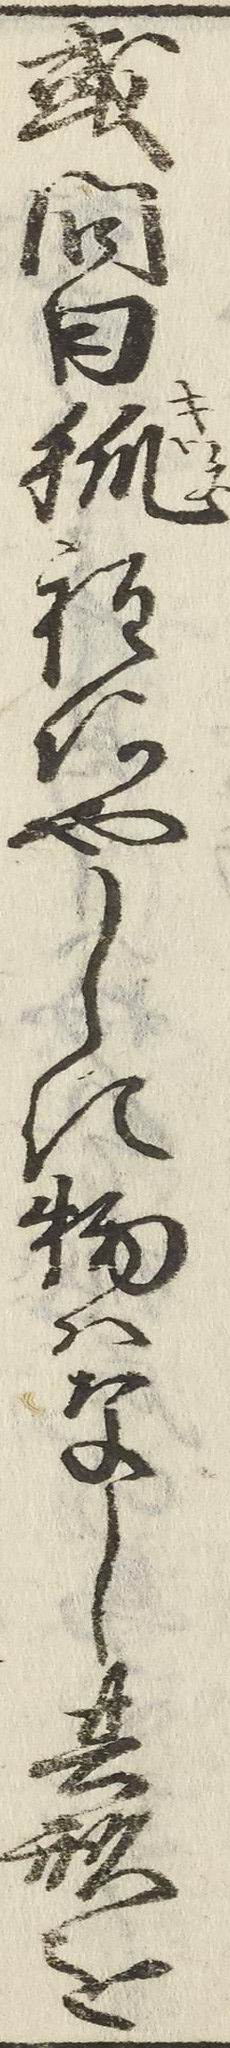或問曰狐程あやしき物はなし其形を
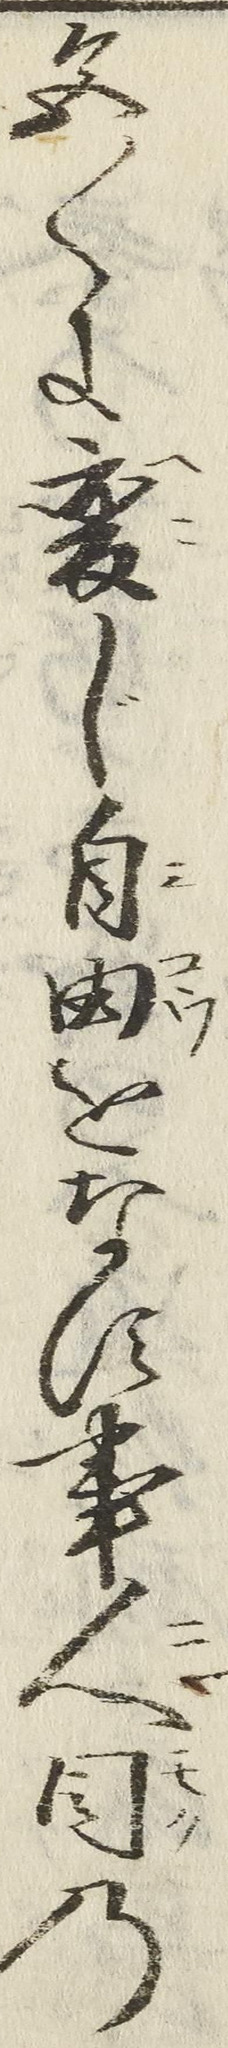色〳〵に変じ自由をなす事人目の
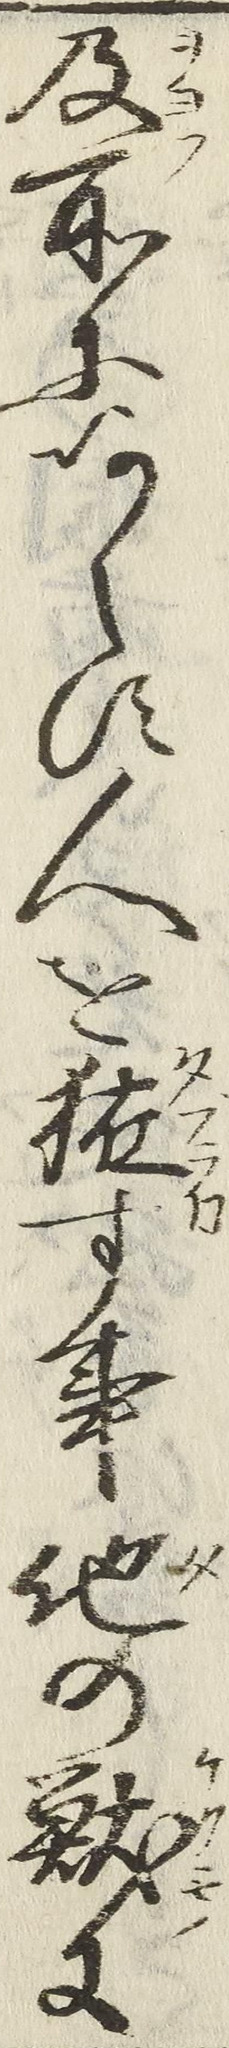及所にあらす人を誑す事他の獣に
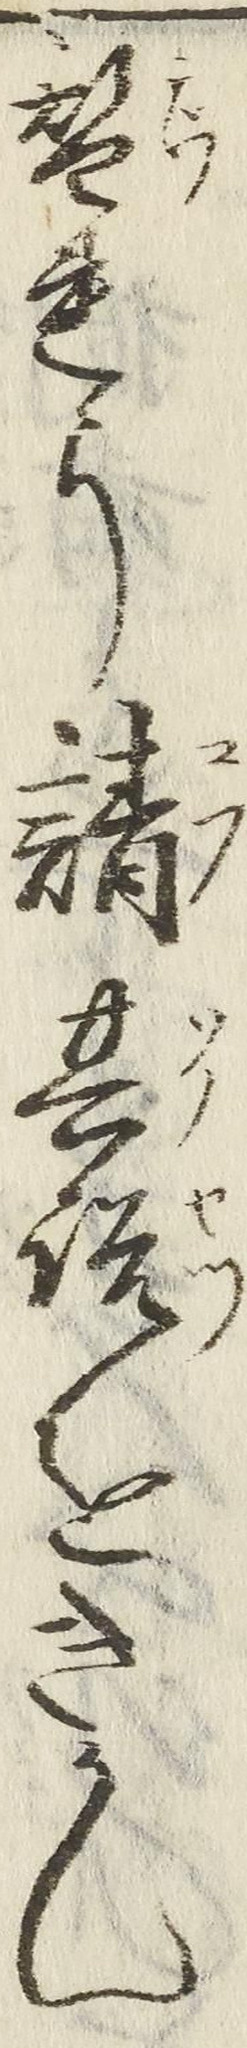替れり請其説をきかん
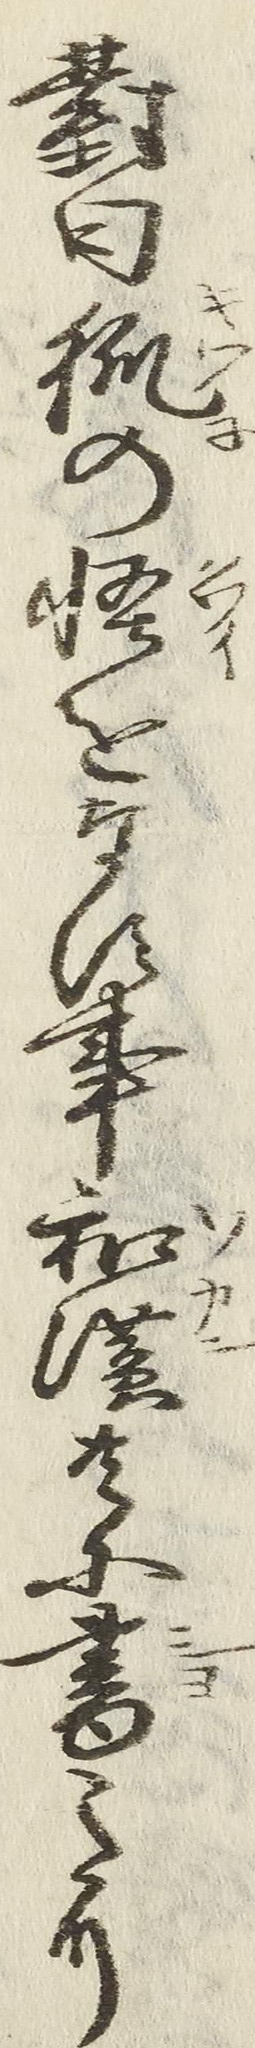対曰狐の怪をなす事和漢共に書々に
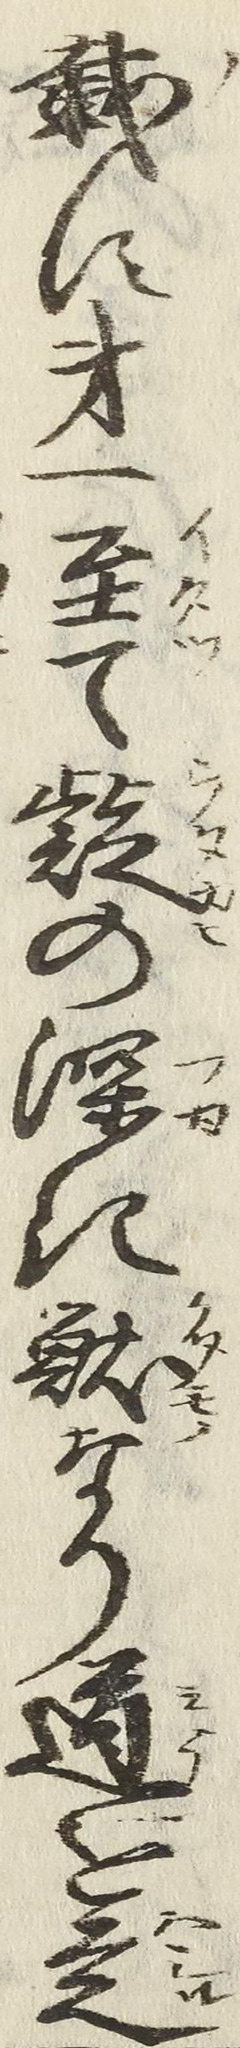載す第一至て疑の深き獣なり道を走
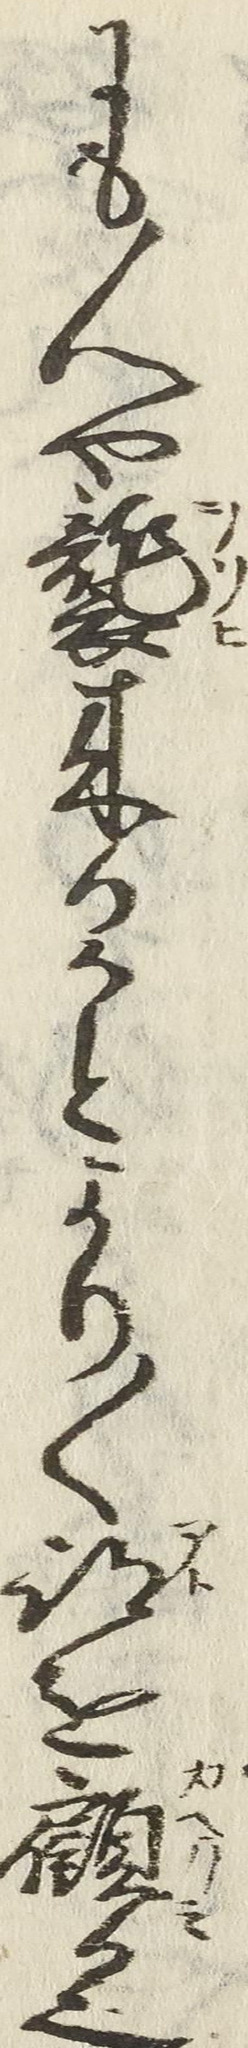にも人や襲来るかとより〳〵跡を顧る也
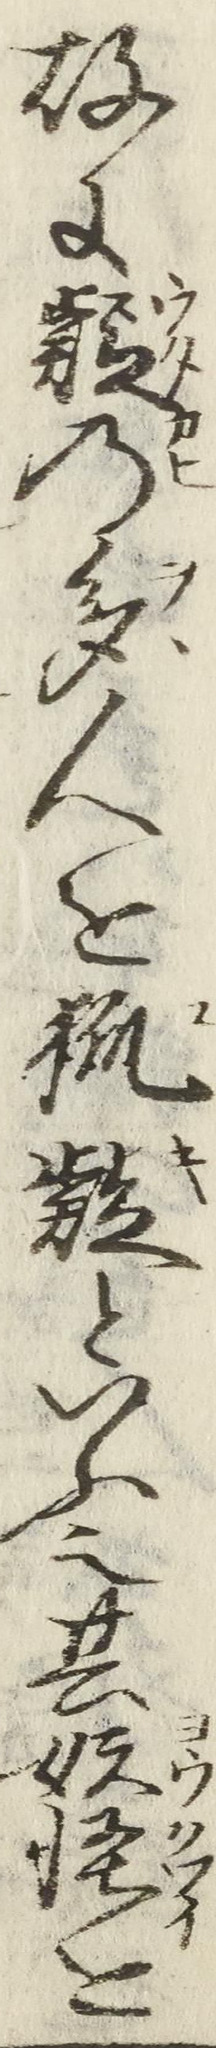故に疑の多人を狐疑といふ也其妖怪を
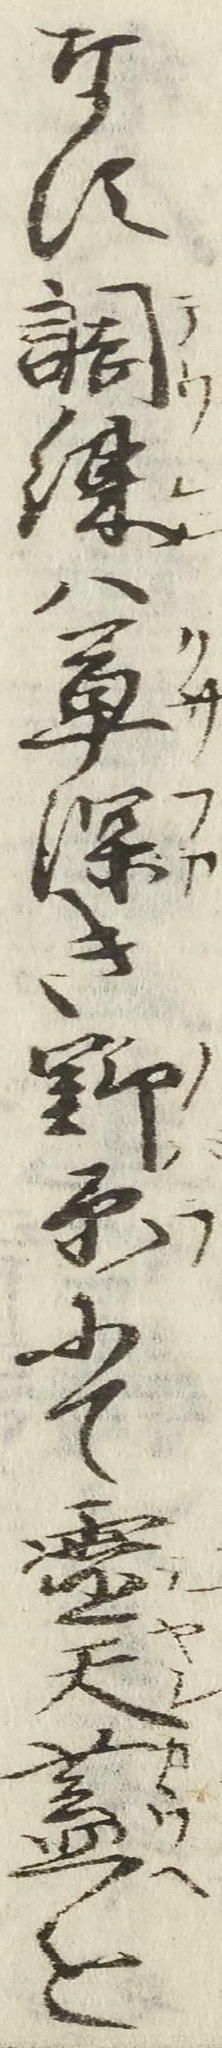なす調練は草深き野原にて霊天蓋を
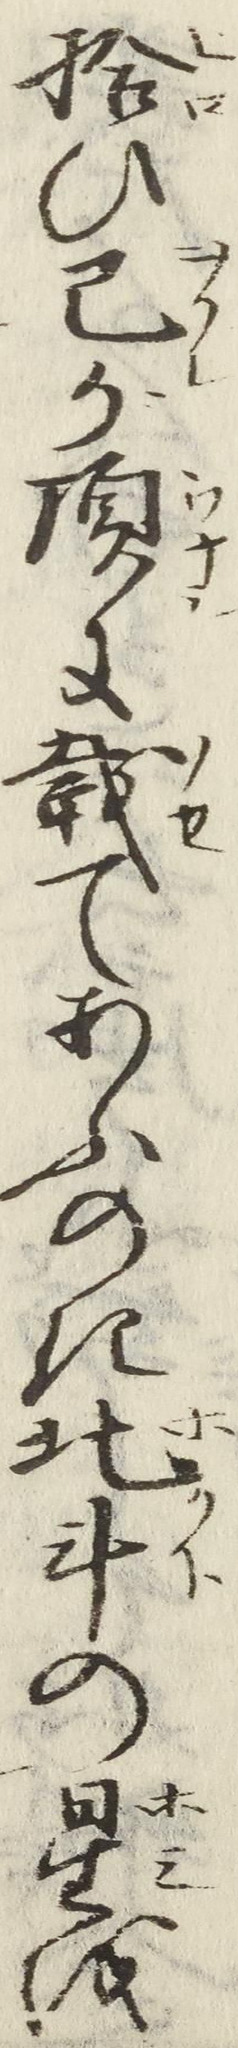拾ひ己が項に載てあふのき北斗の星を
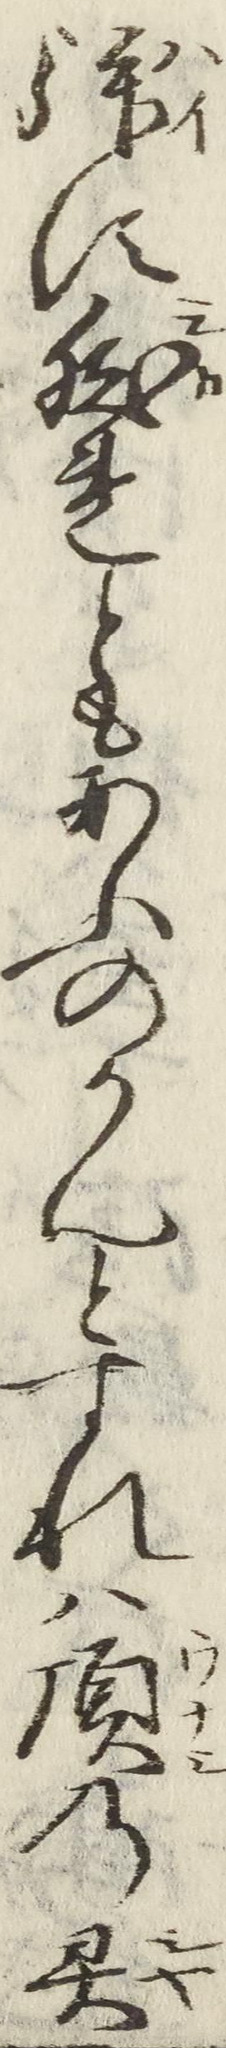拝す然れともあふのかんとすれは項の霊
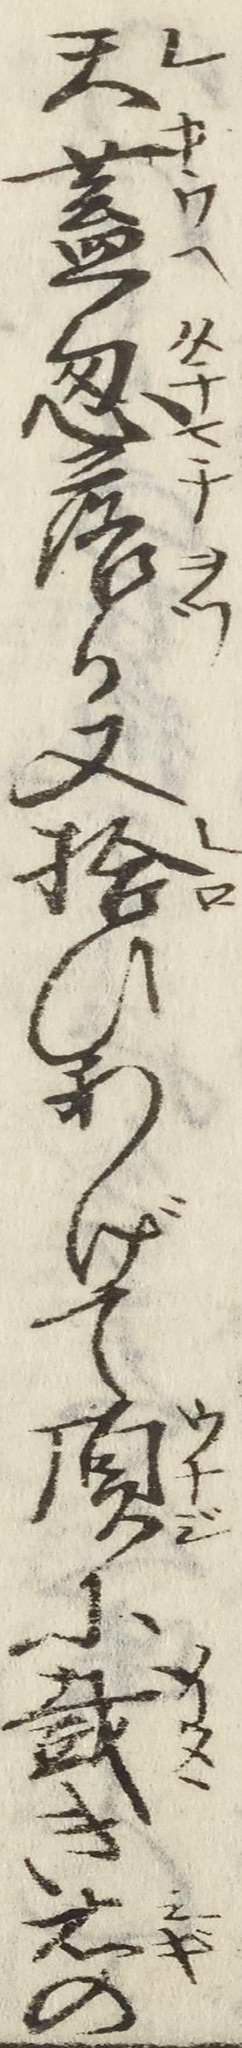天蓋忽落る又拾ひあげて項に戴き右の
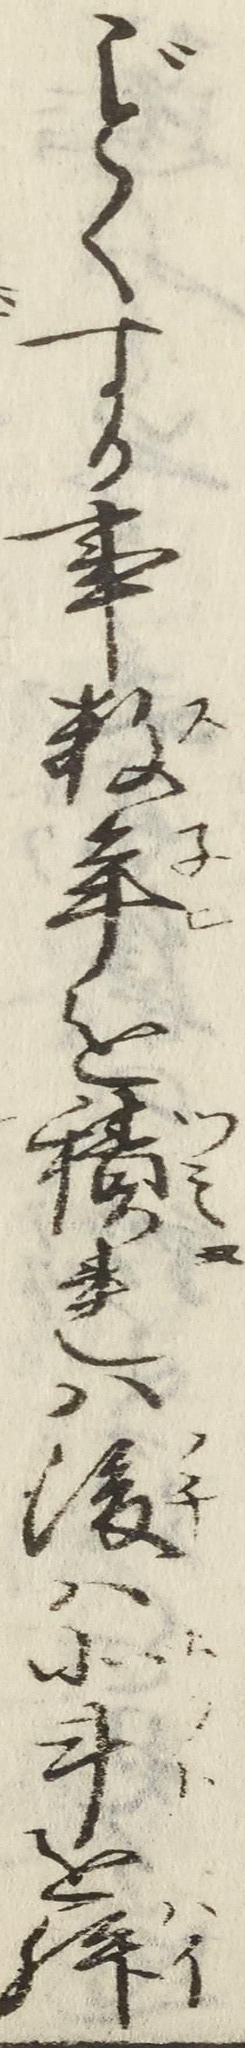ごとくする事数年を積れは後は北斗を拝
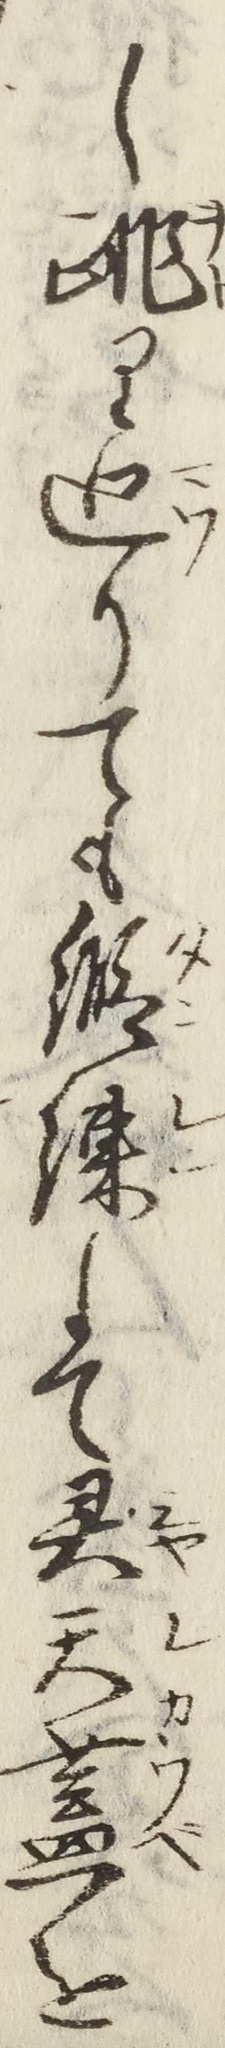し跳り廻りても鍛錬にて霊天蓋を
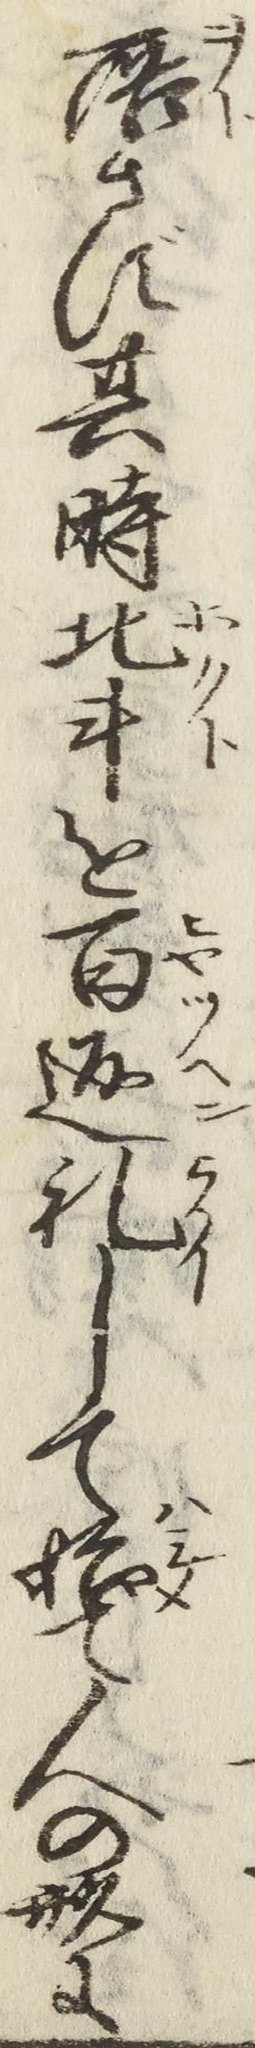落さず其時北斗を百返礼して始て人の形に
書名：天地或問珍　地
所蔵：東京大学地震研究所図書室 Earthquake Research Institute Library, The University of Tokyo, JAPAN
